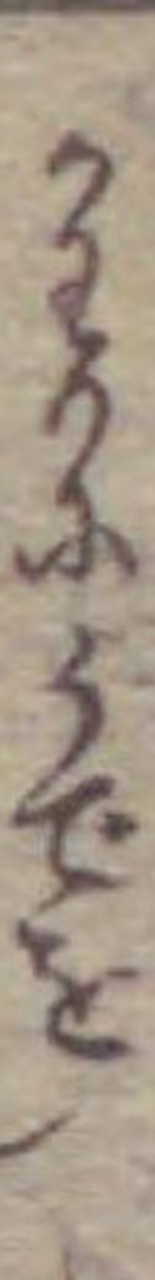かわりにうでを
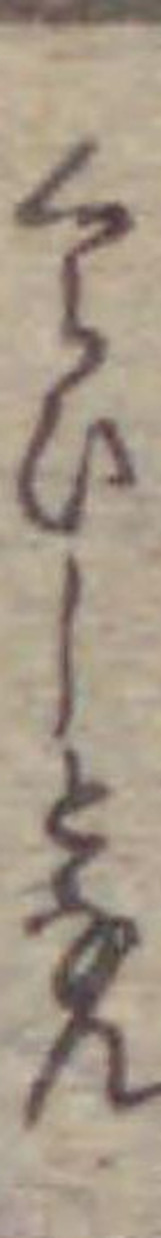くらひしとなん
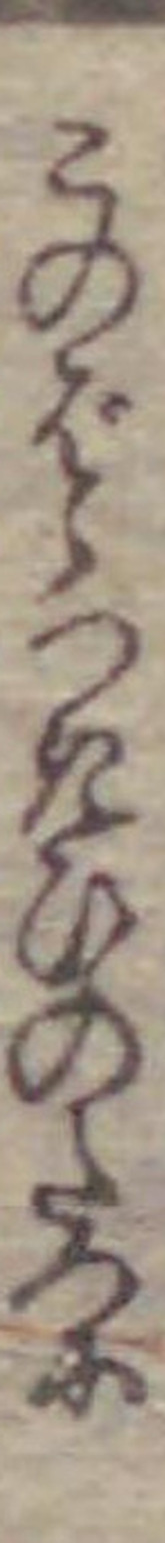このばゝつきひのたつに
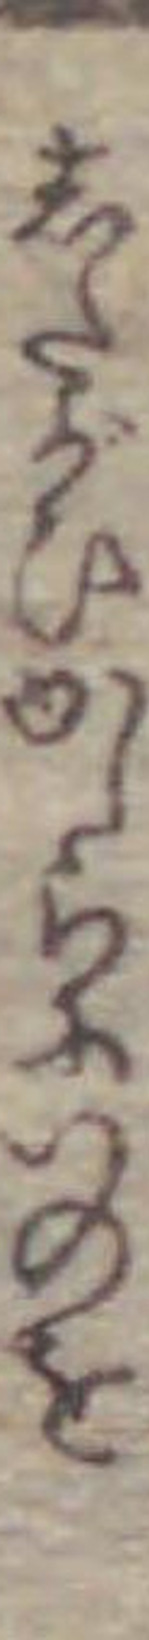したがひかしらにつのを
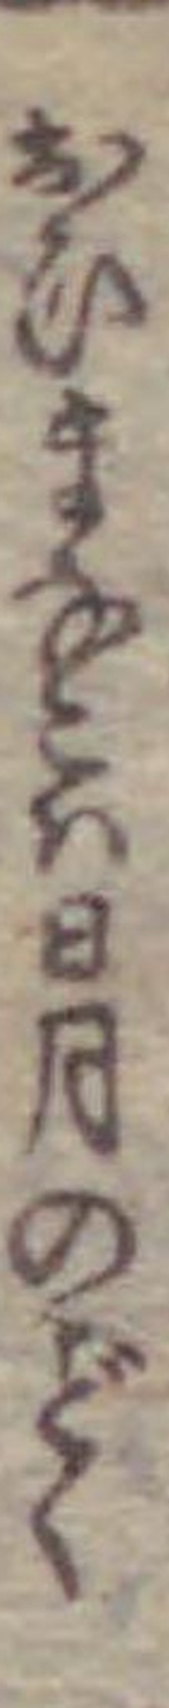おひまなこは日月のごとく
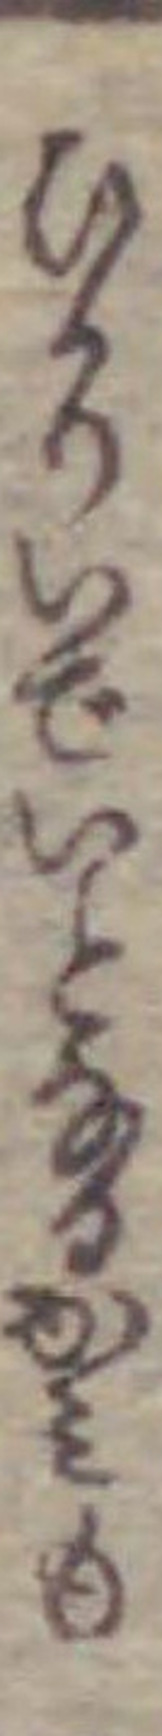ひかりいでいとなるかみも
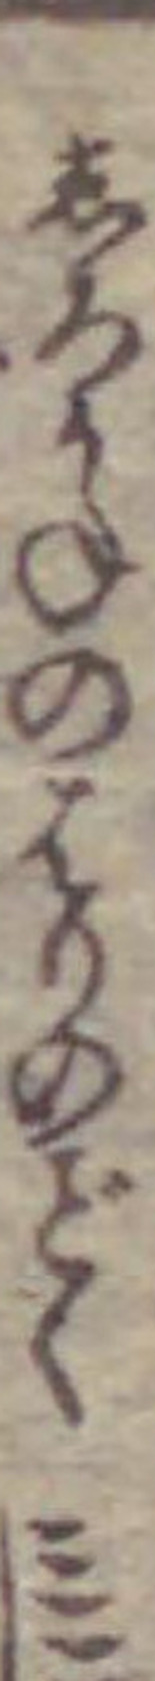しろかねのはりのごとく
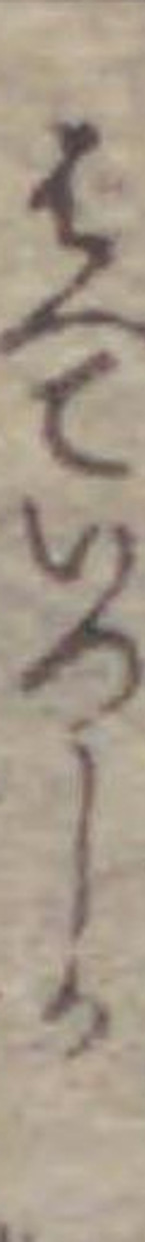はへていつしか
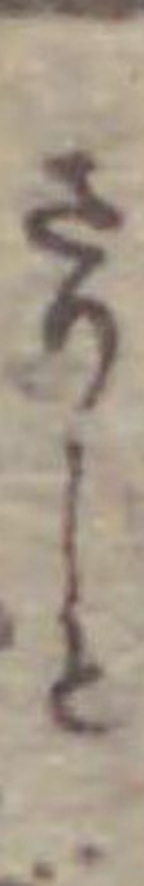さりしと
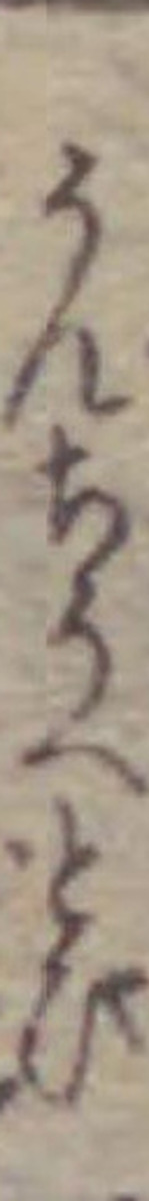うんちうへとび
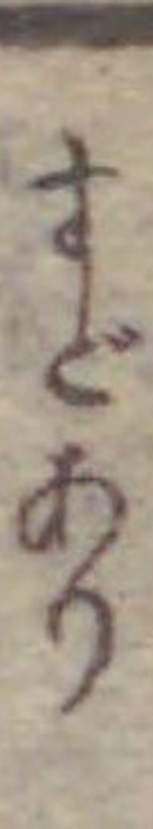すどあり
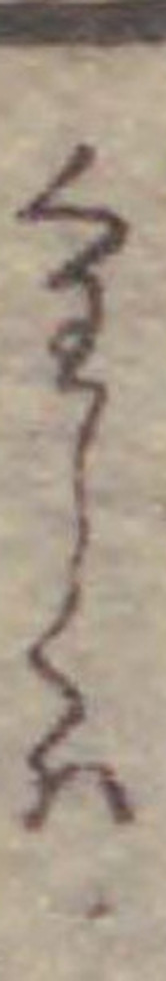くわしくは
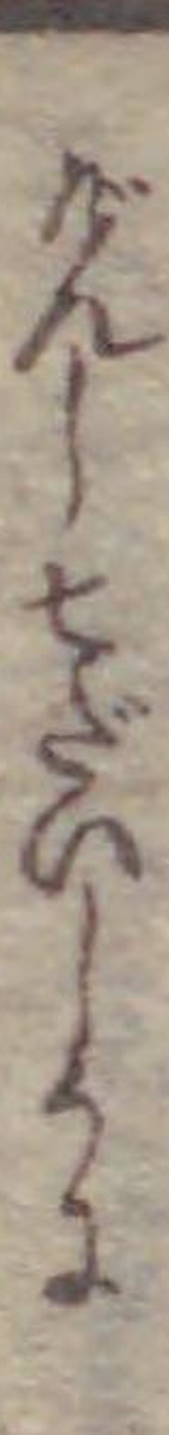げんし七だいしうに
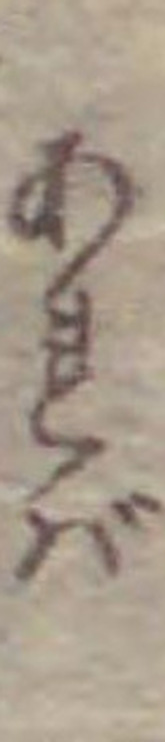あれば
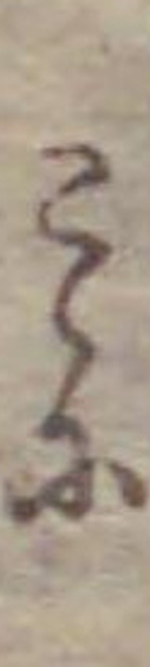こゝに
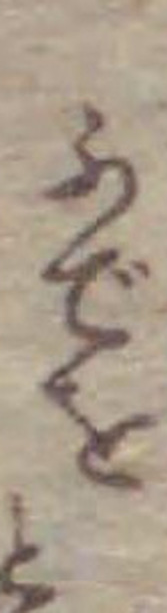ふでを
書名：武家物奇談 : 3巻
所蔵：国立国会図書館 National Diet Library, JAPAN
